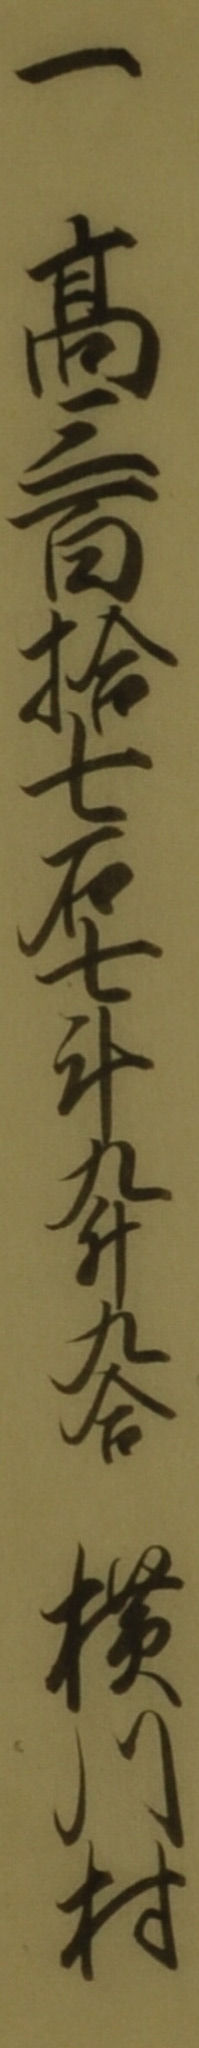一高三百拾七石七斗九升九合横川村
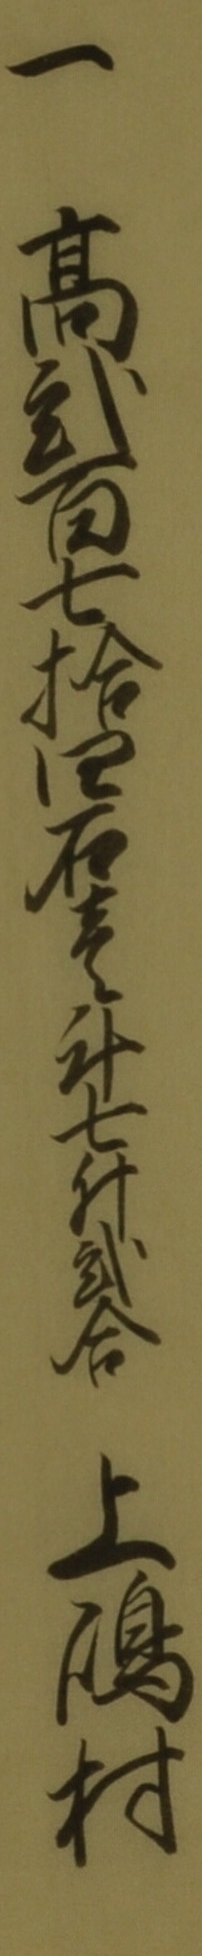一高弐百七拾四石壱斗七升弐合上島村
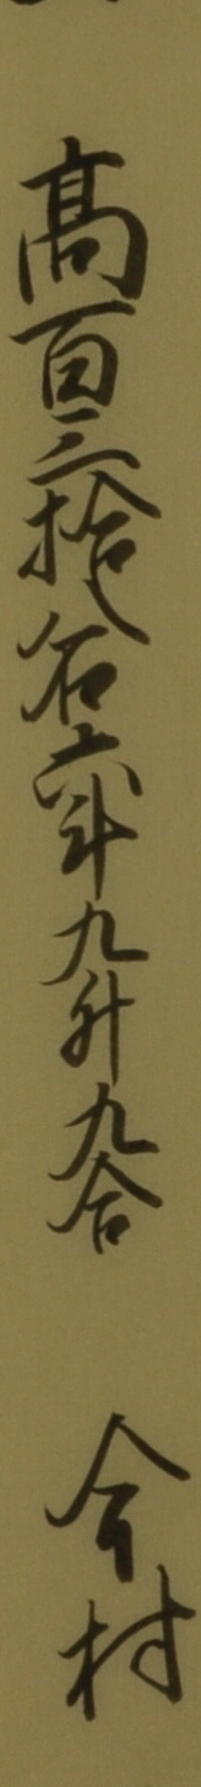一高百三拾八石六斗九升九合今村
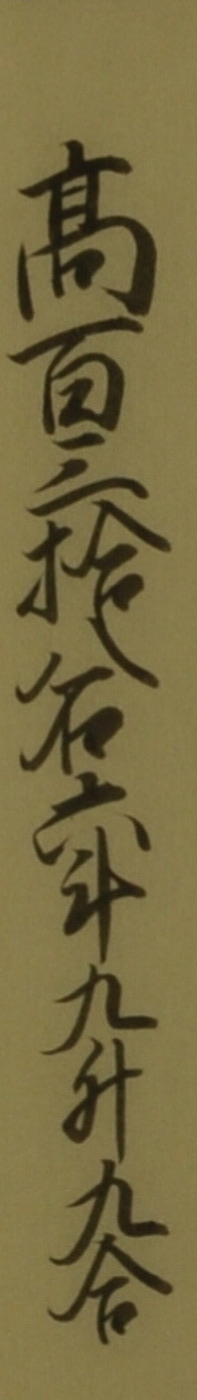一高百三拾八石六斗九升九合今村

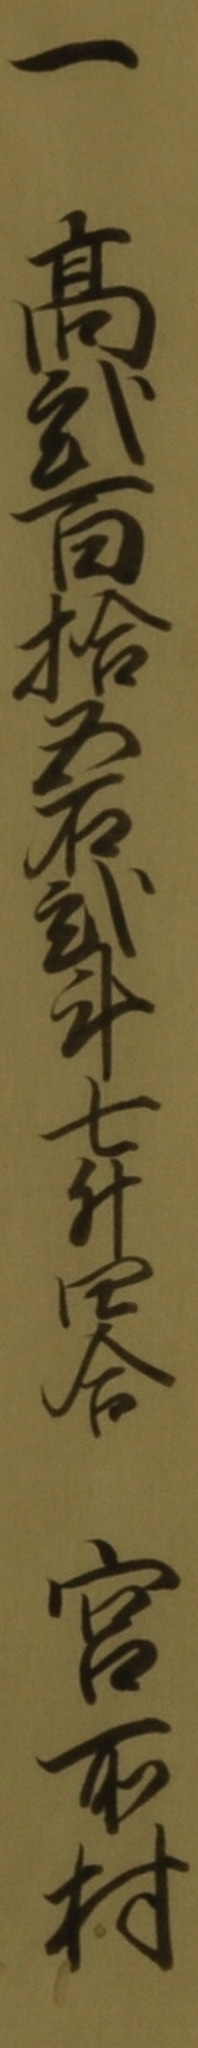一高弐百拾五石弐斗七升四合宮所村
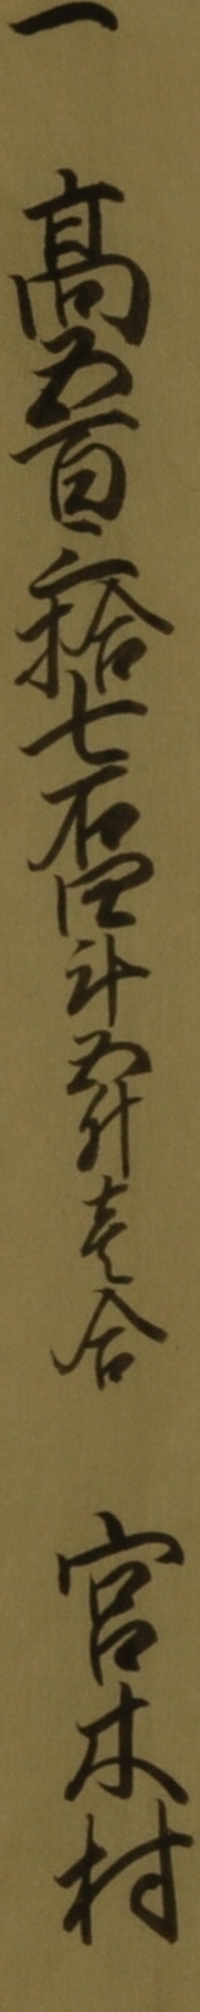一高五百三拾七石四斗五升壱合宮木村
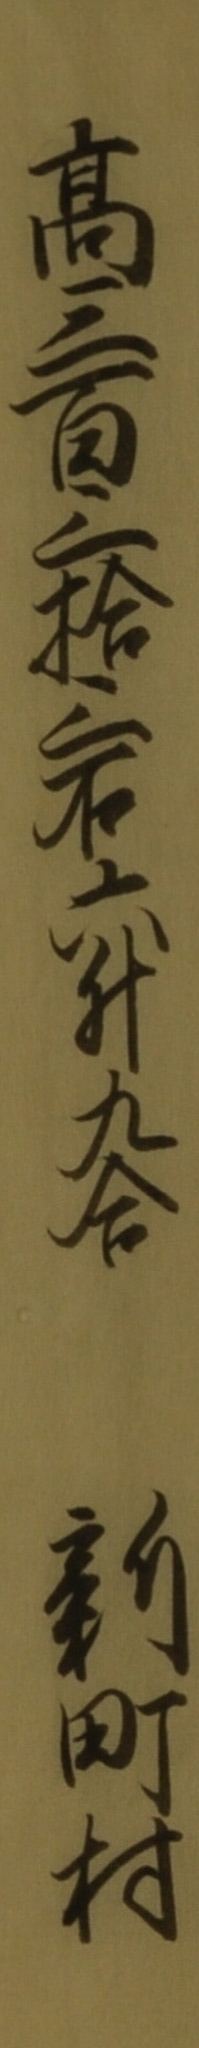一高三百三拾三石六升九合新町村
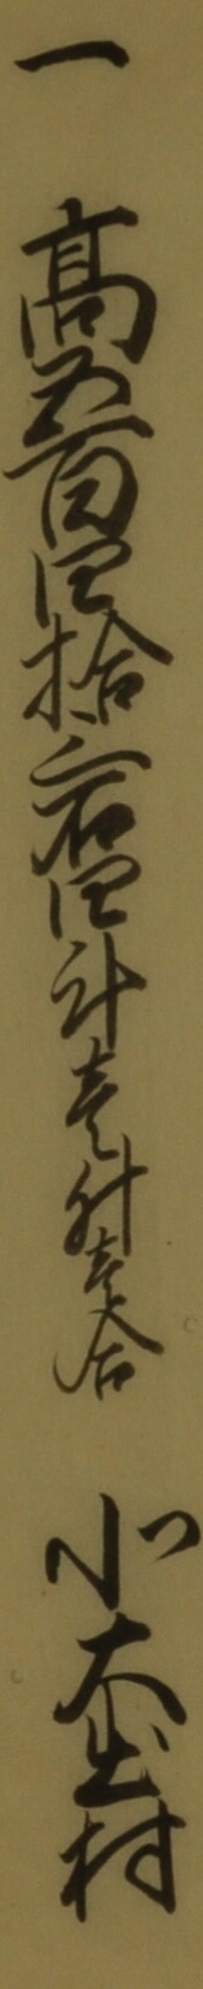一高五百四拾三石四斗壱升壱合北大出村
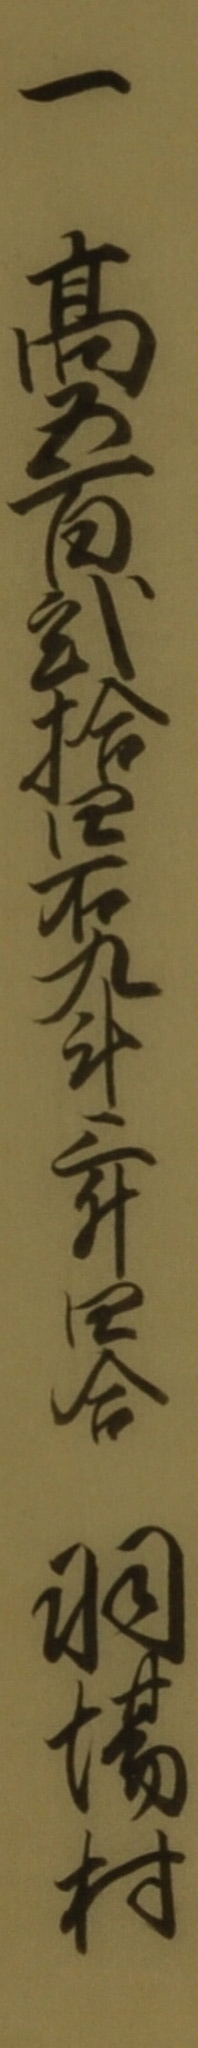一高五百弐拾四石九斗三升四合羽場村
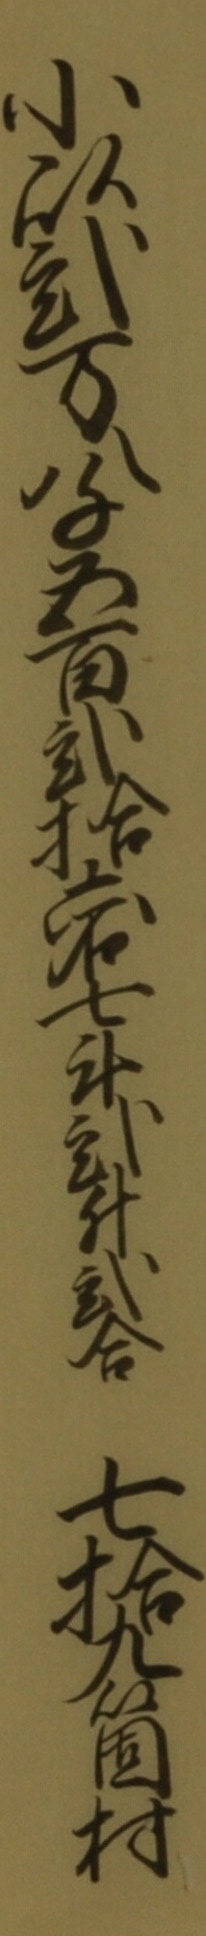小以弐万八千五百弐拾六石七斗弐升弐合七拾九箇村

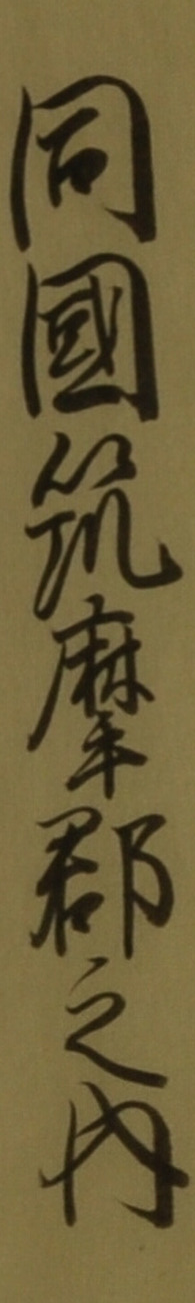同国筑摩郡之内
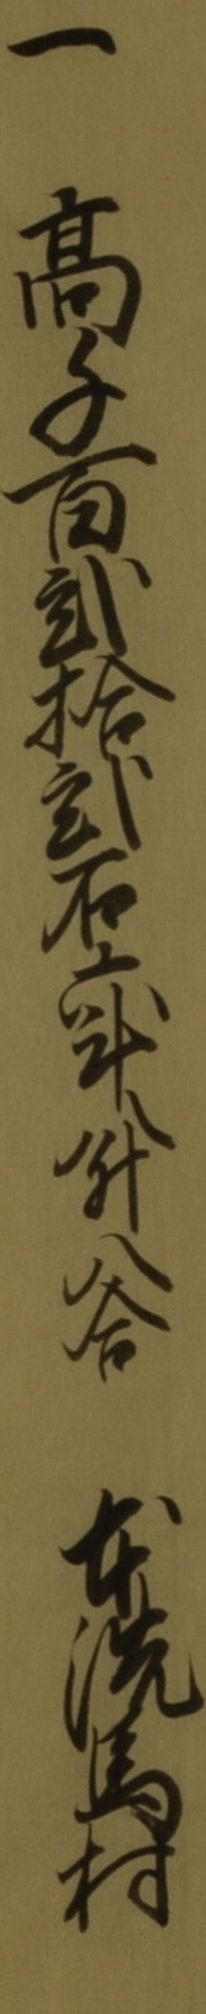一高千百弐拾弐石六斗八升八合本洗馬村
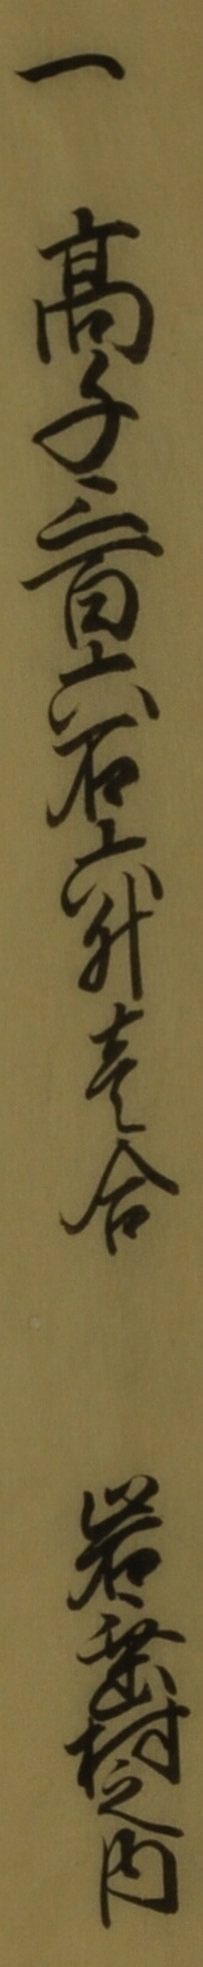一高千三百六石六升壱合岩垂村之内
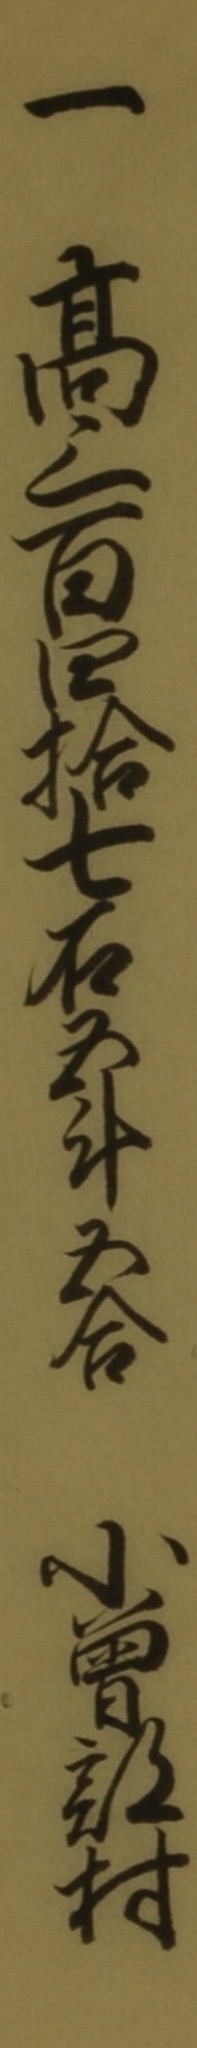一高三百四拾七石五斗五合小曾部村
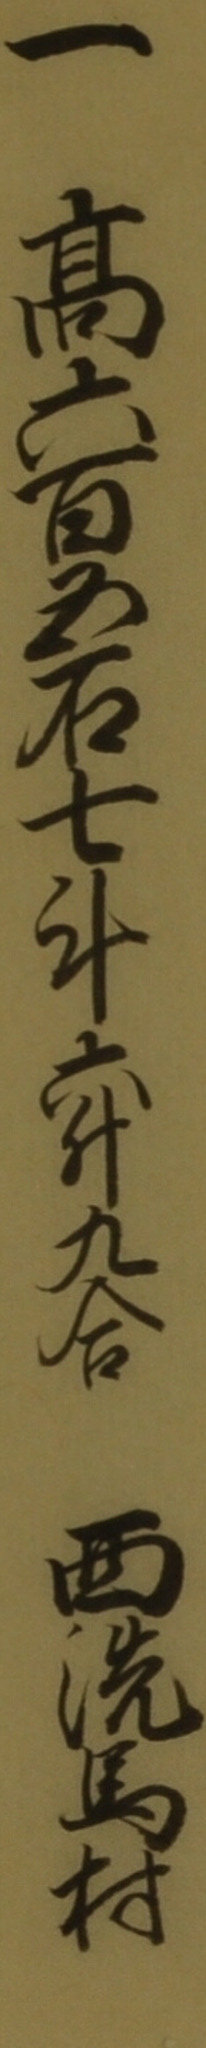一高六百五石七斗六升九合西洗馬村
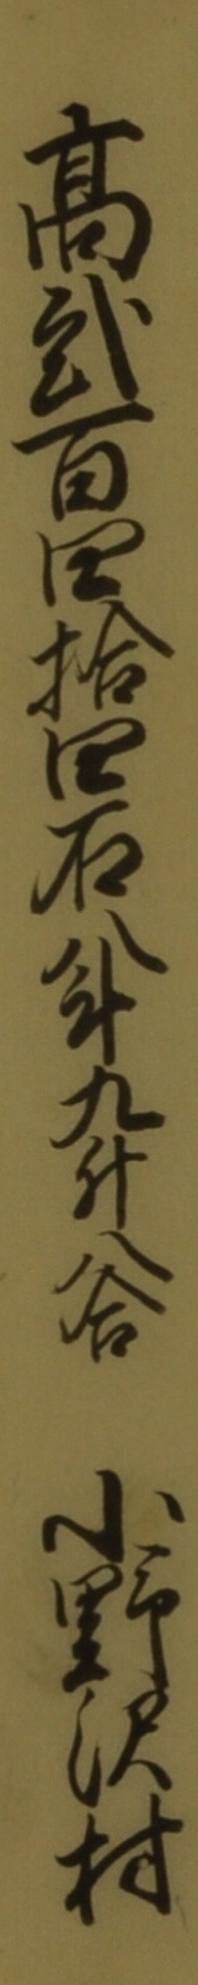一高弐百四拾四石八斗九升八合小野沢村
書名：信濃国伊那郡筑摩郡高遠領知郷村高辻帳
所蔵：伊那市立高遠町図書館・合同会社AMANE
